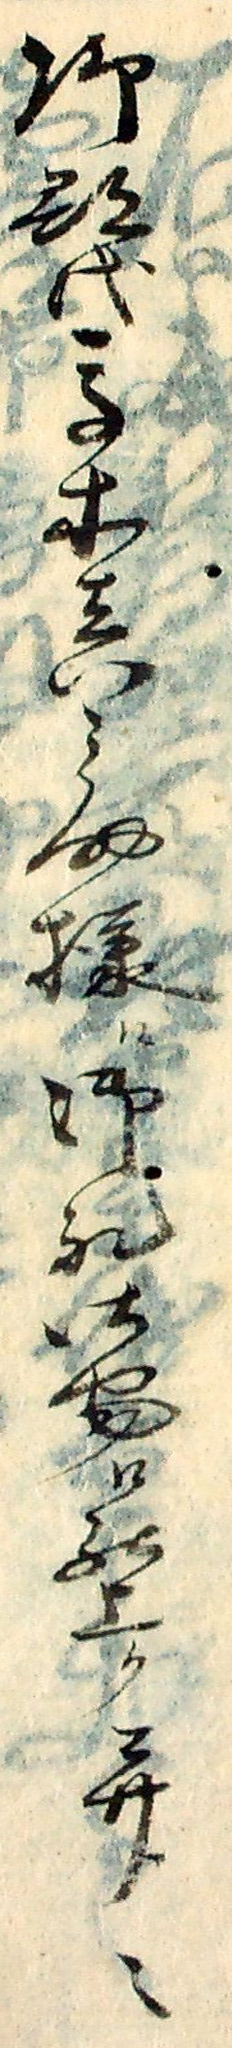御郡代高木真之助様え御礼御宅え罷上り并に
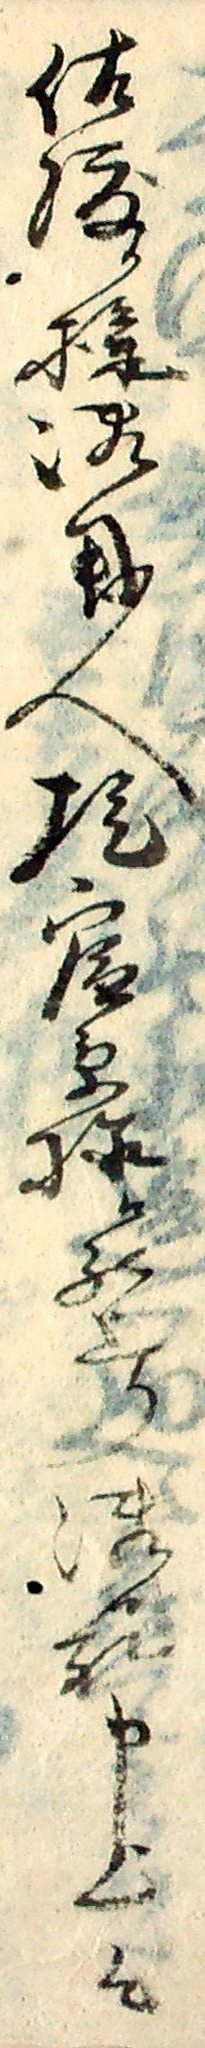佐渡り様御用人堤官兵衛様え罷上り御礼申上候
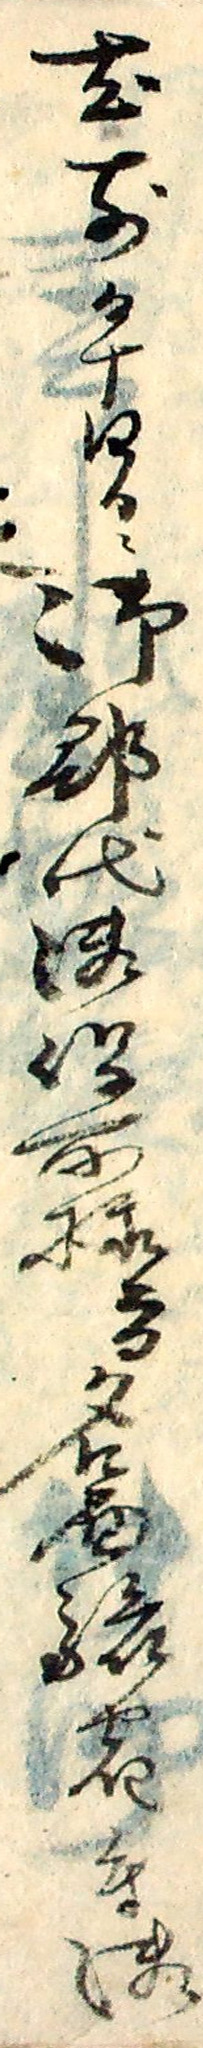尤前日十四日に御郡代御役所様方名面旅宿付御
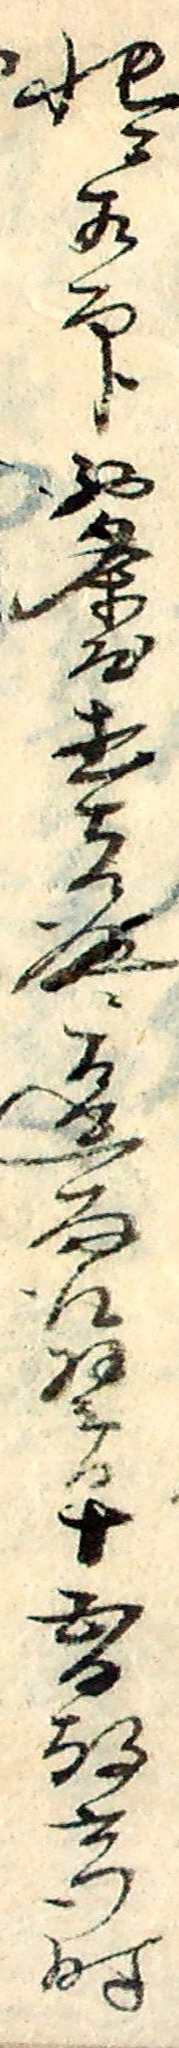帳に相印西条屋直右衛門殿に逗留仕翌日十五日朝六つ時
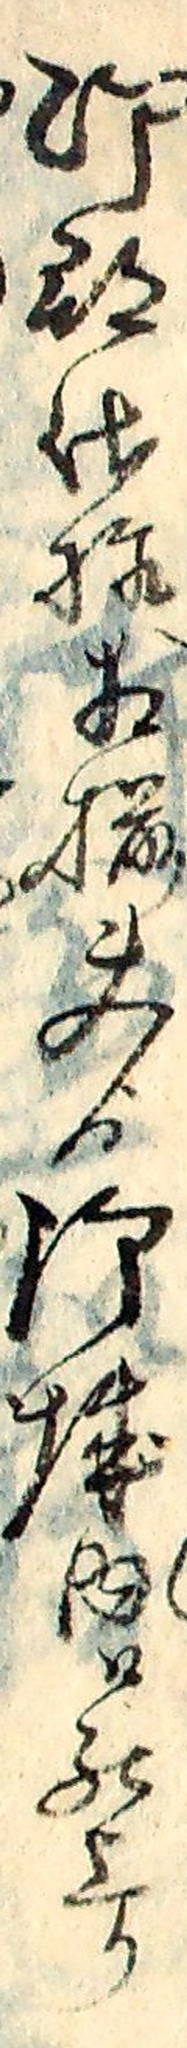御郡代様相揃夫ゟ御城内え罷上り
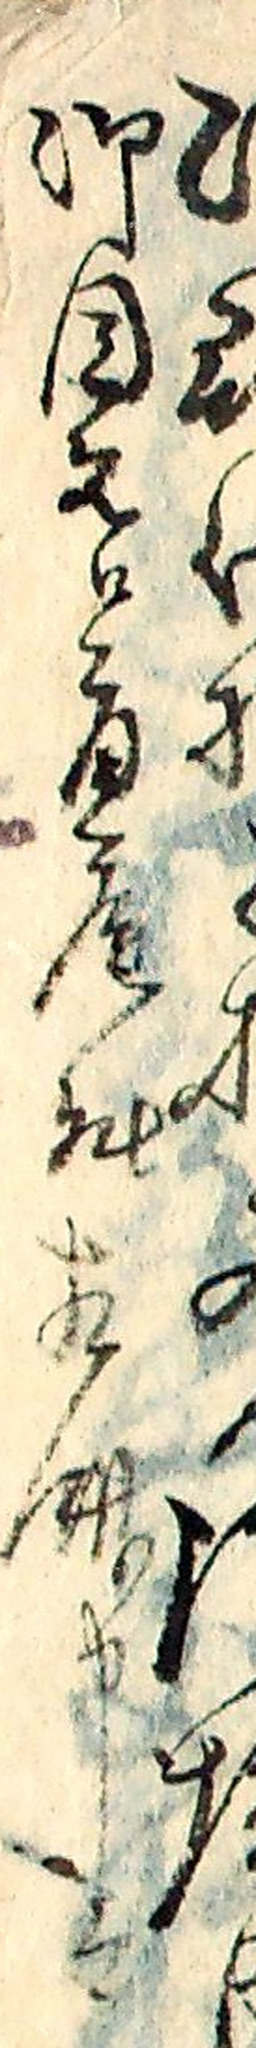御目見え首尾能相済申候

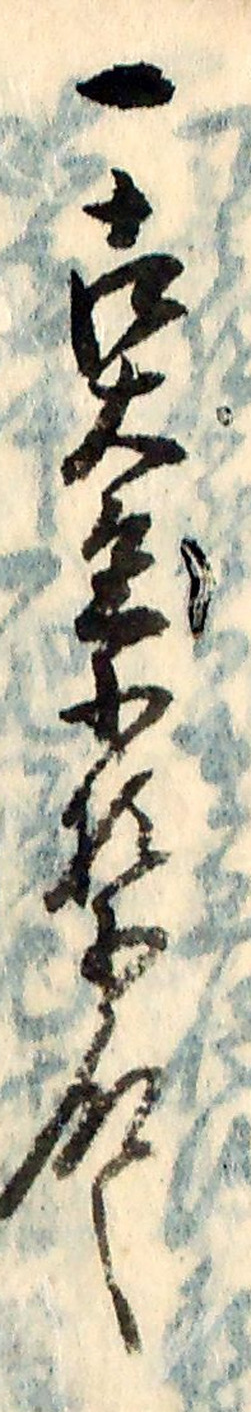一古大豆五拾五石也
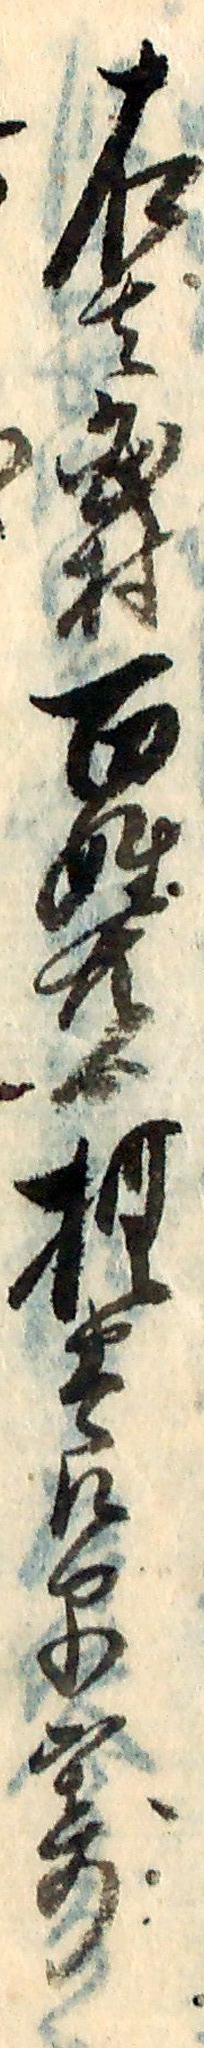右は当村百姓共ゟ撫養早崎
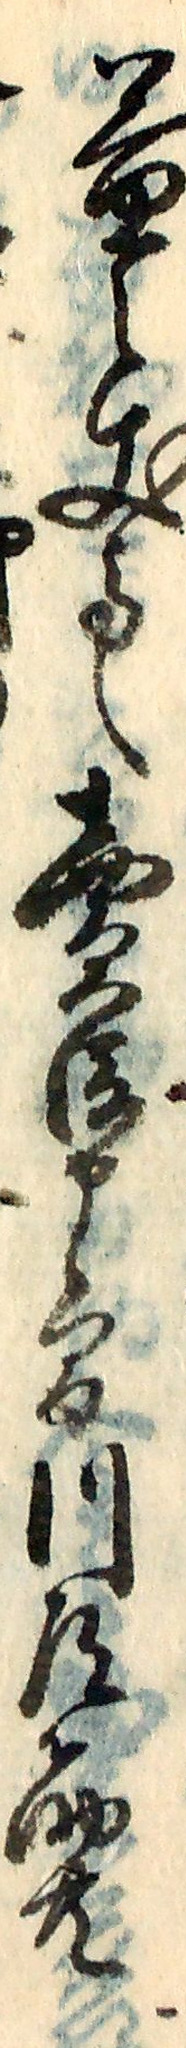益之丈方へ売渡申候間川道筋共
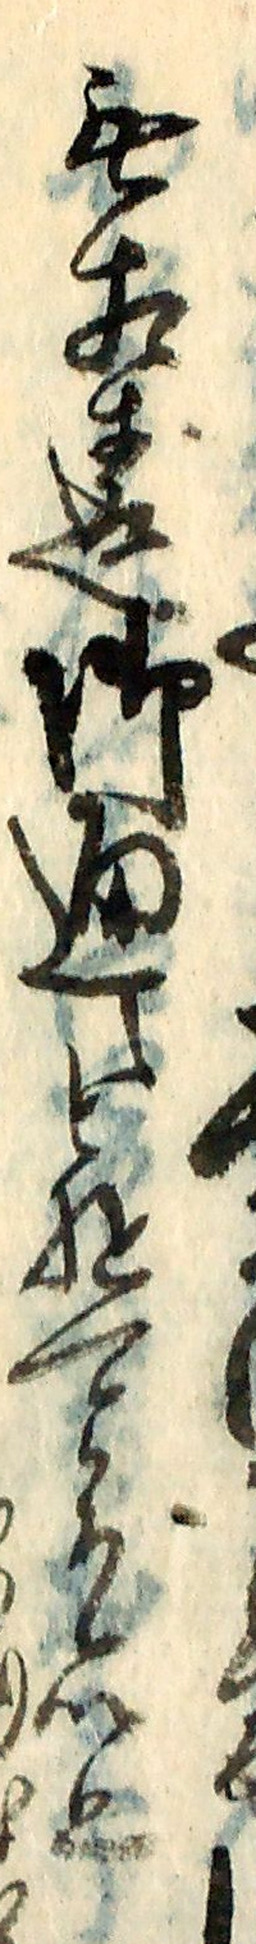無相違御通し被遊可被下候以上
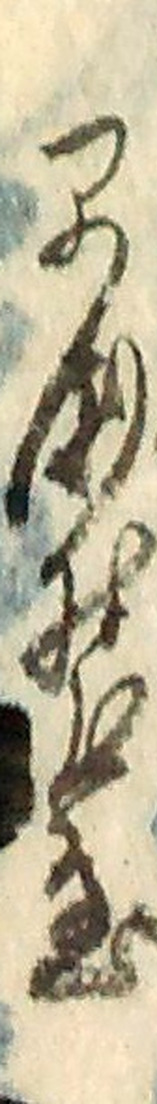早淵村庄屋
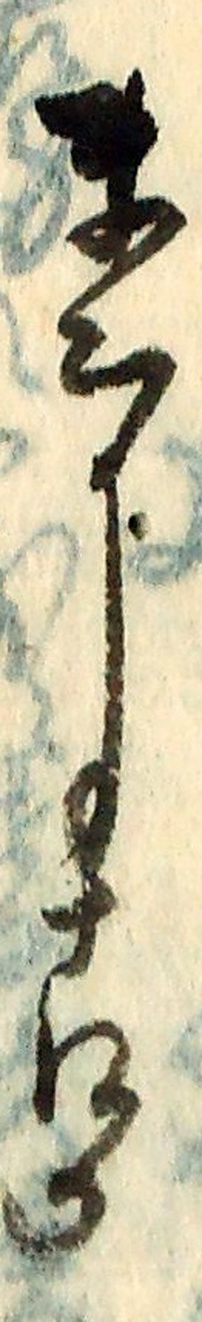未二月十四日
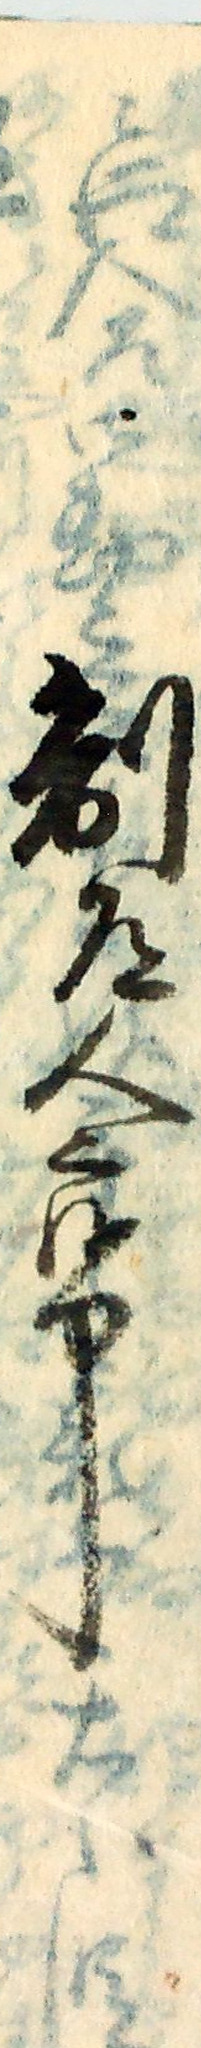制道人衆中
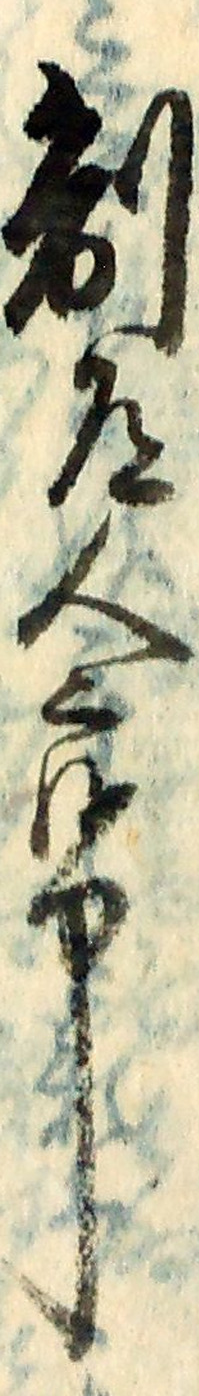制道人衆中
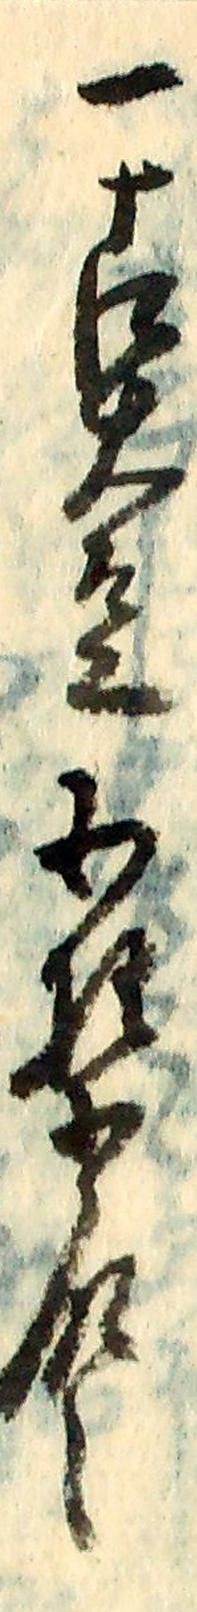一古大豆五拾五石也
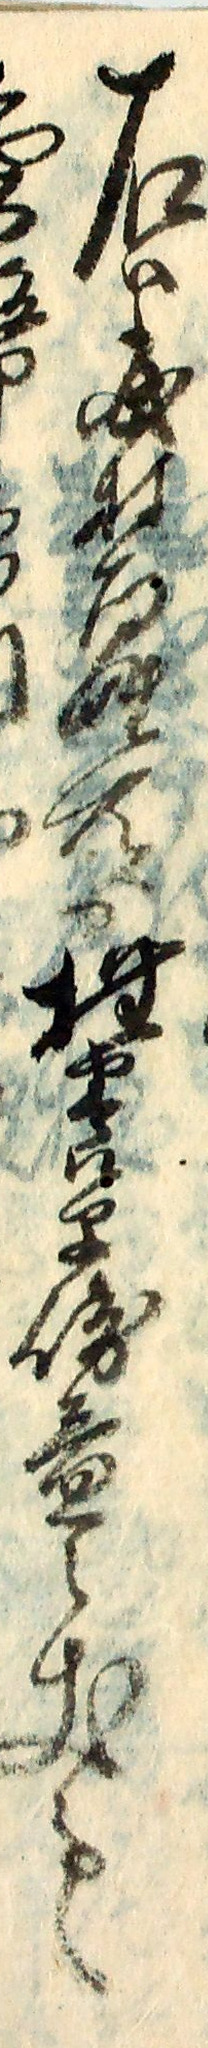右は当村百姓共ゟ撫養早崎益之丈方へ
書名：諸御願書控(後藤氏壱番）
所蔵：鳴門教育大学 Naruto University of Education
